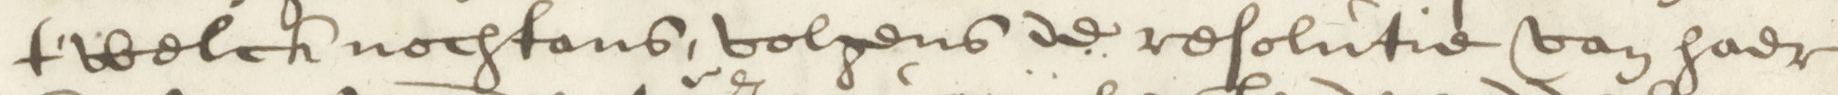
t'welck nochtans, volgens de resolutie van haer
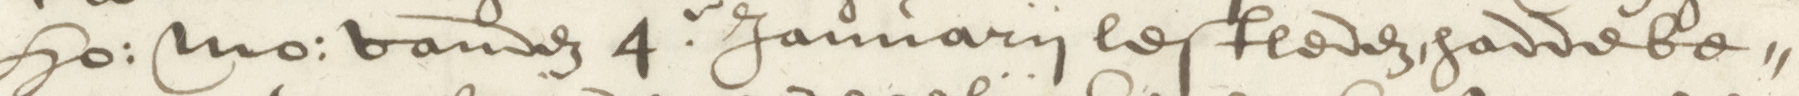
Ho:Mo: vanden 4e. Januarij lestleden, hadde be„
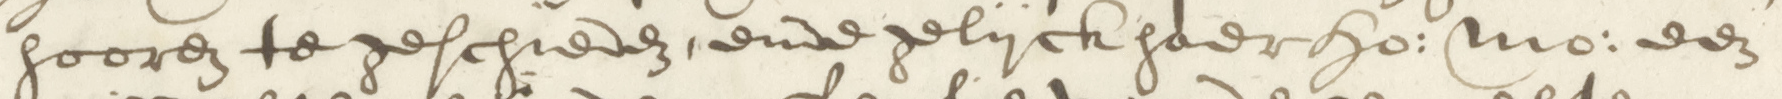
hooren te geschieden, ende gelijck haer Ho:Mo: een
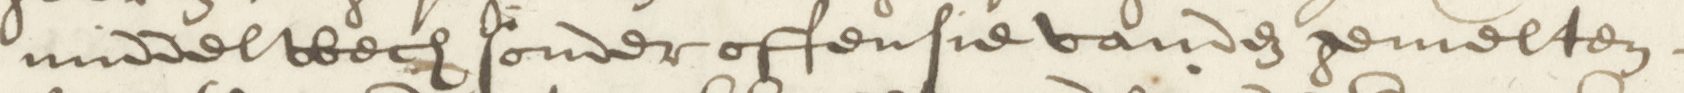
middelwech sonder offensie vanden gemelten
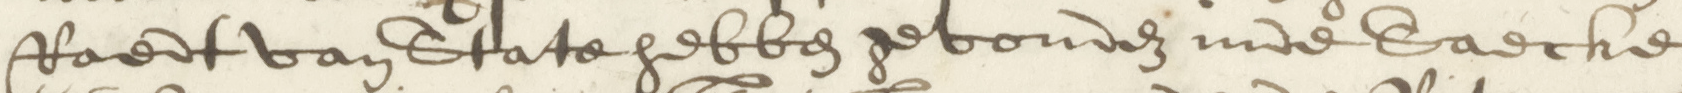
Raedt van State hebben gevonden inde Saecke
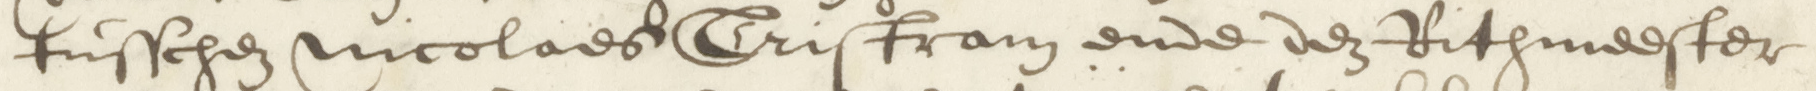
tusschen Nicolaes Tristram ende den Rithmeester
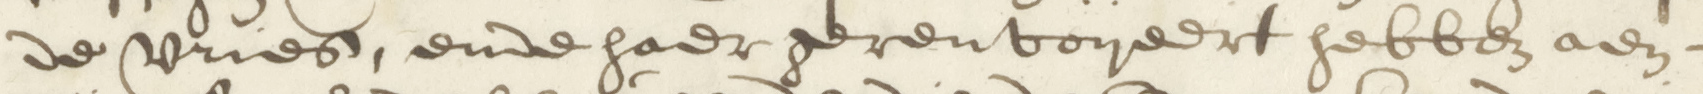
de Vries, ende haer gerenvoijeert hebben aen
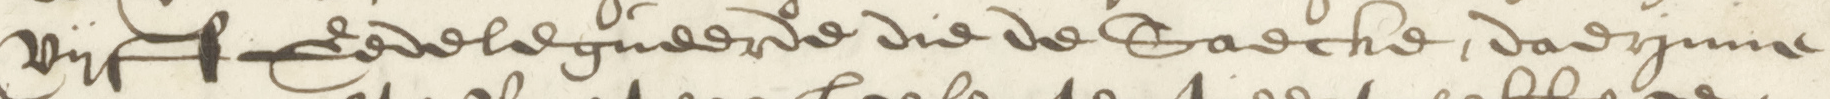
vijff Gedelegueerde die de Saecke, daerinne
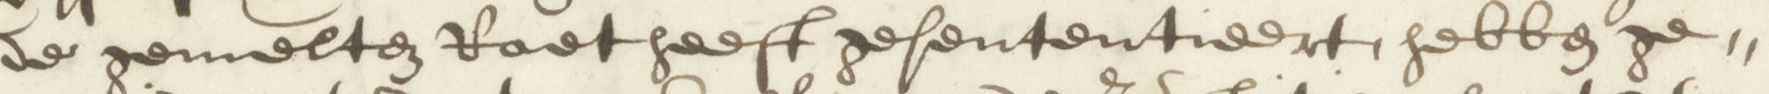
de gemelten Raet heeft gesententieert, hebben ge„
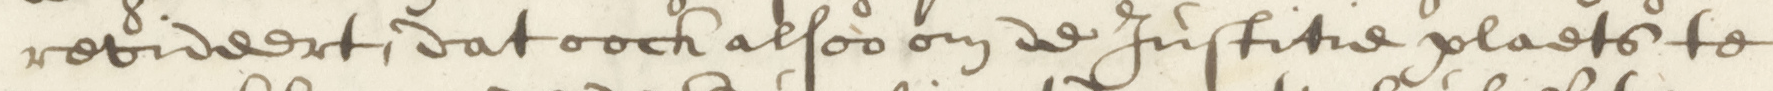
revideert, dat oock alsoo om de Justitie plaets te
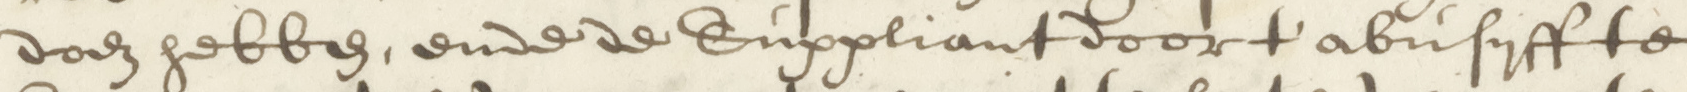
doen hebben, ende de Suppliant door t'abusyff te
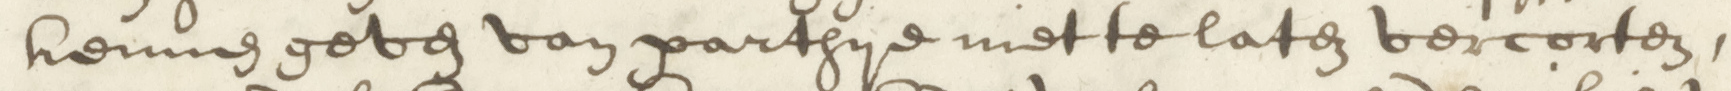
kennen geven van parthije niet te laten vercorten,
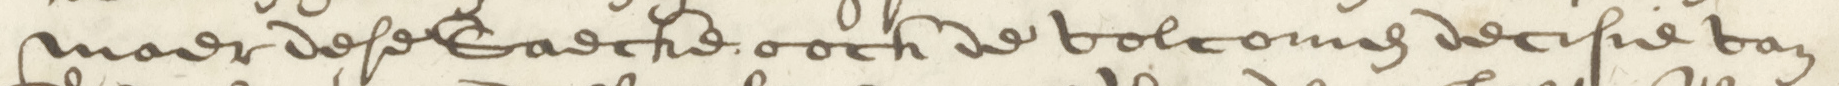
maer dese Saecke oock de volcomen decisie van
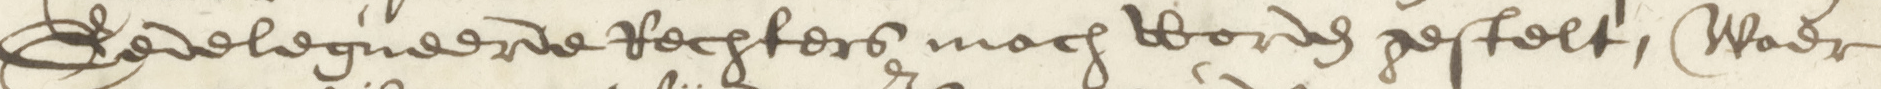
Gedelegueerde Rechters mach worden gestelt. Waer
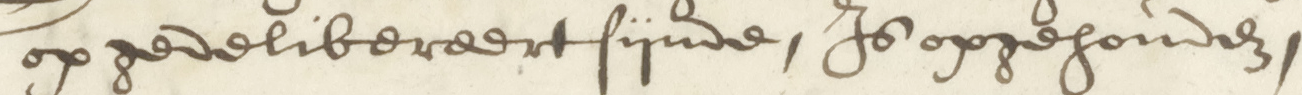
op gedelibereert sijnde, Is opgehouden.
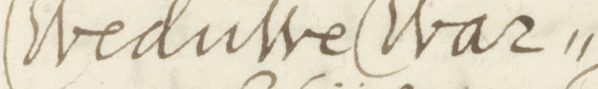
Weduwe War„
